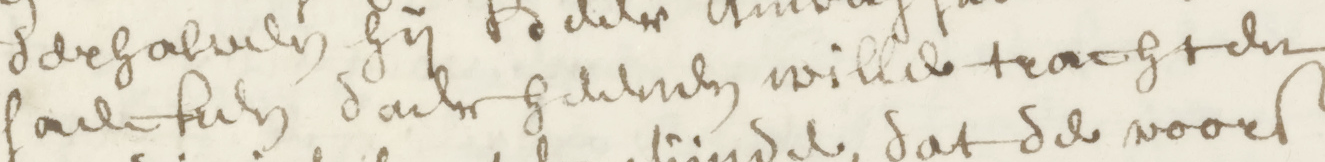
saecken daerheenen wille trachten
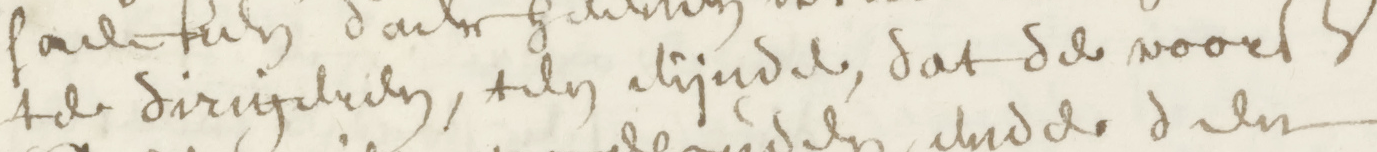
te dirigeren, ten eijnde, dat de voors
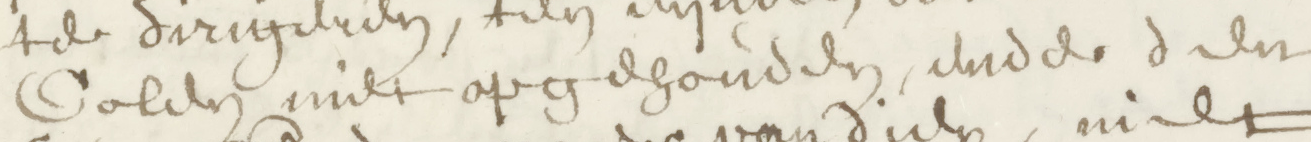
Colen niet opgehouden, ende den
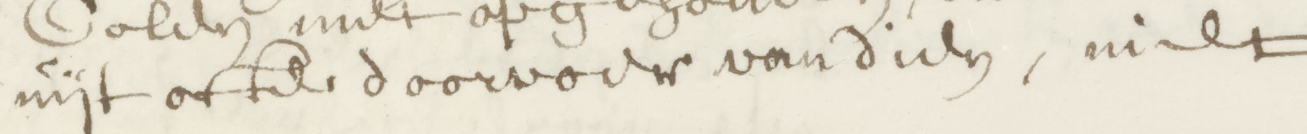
uijt ofte doorvoer van dien, niet
